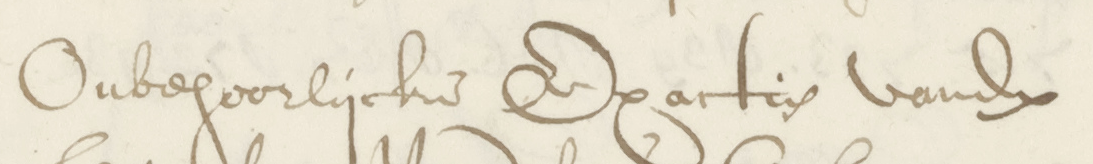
Onbehoorlicke Exactien vanden
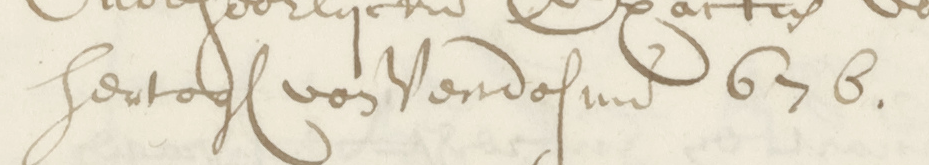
hertogh van Vendosme 676.
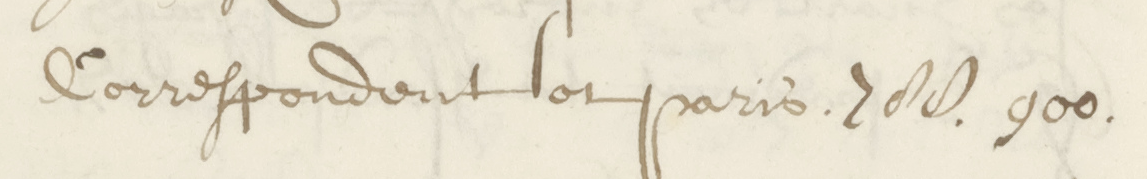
Correspondent tot paris, 788. 900.
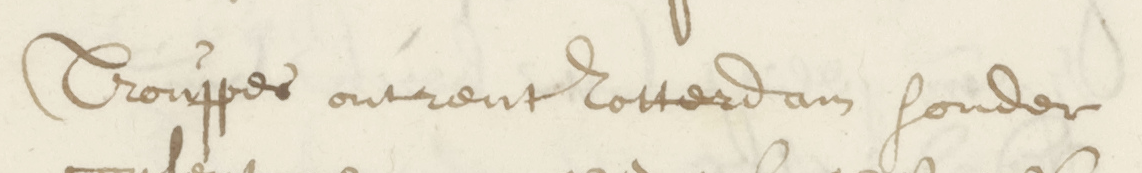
Trouppes ontrent rotterdam sonder
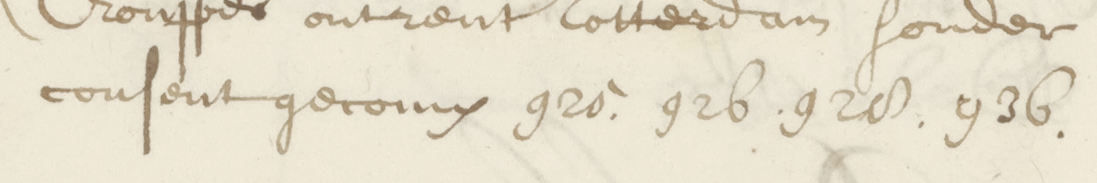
consent gecomen 925, 926, 928, 936.
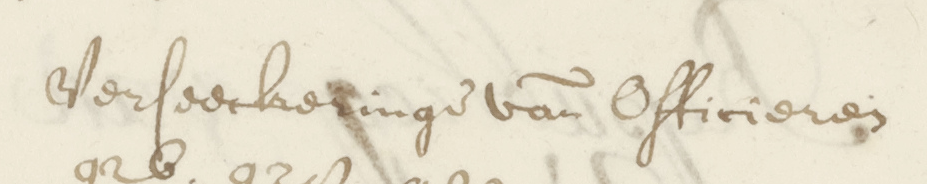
Verseeckeringe van Officieren
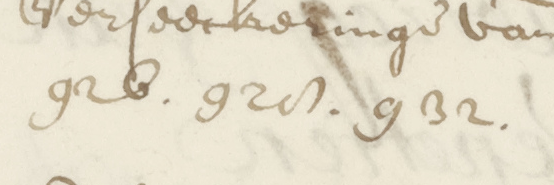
926, 928, 932.
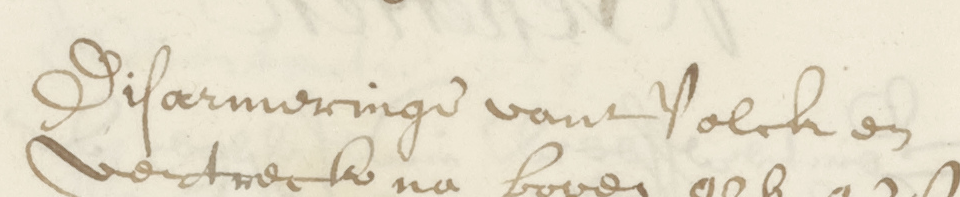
Disarmeringe vant Volck en
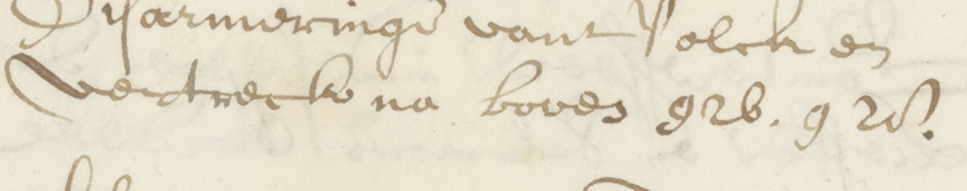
vertreck na boven 926, 928.
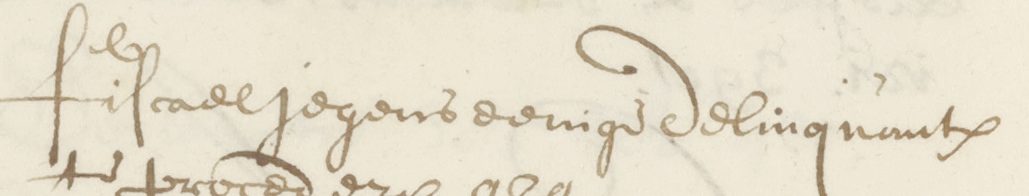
Fiscael jegens eenige delinquanten
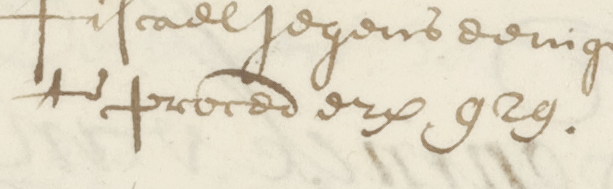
te procederen 929.
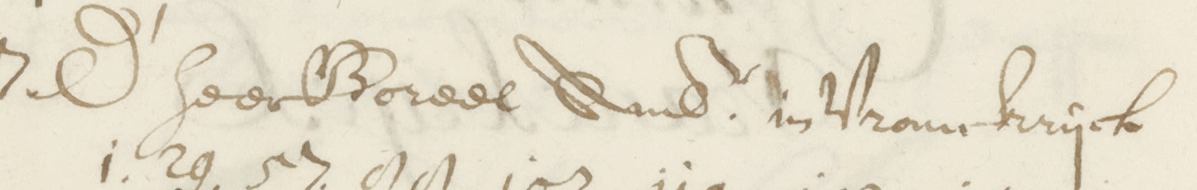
D'heer Boreel Ambr. in Vranckrijck
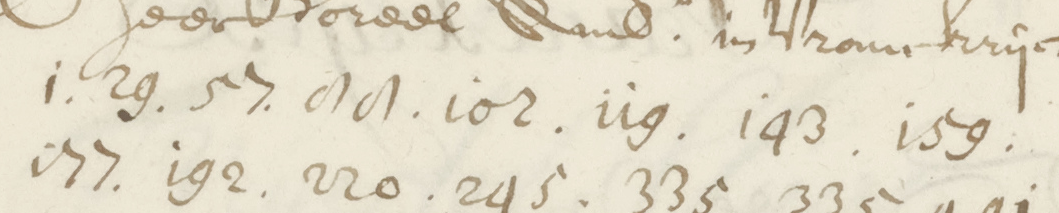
1, 29, 57, 88, 102, 119, 143, 159,
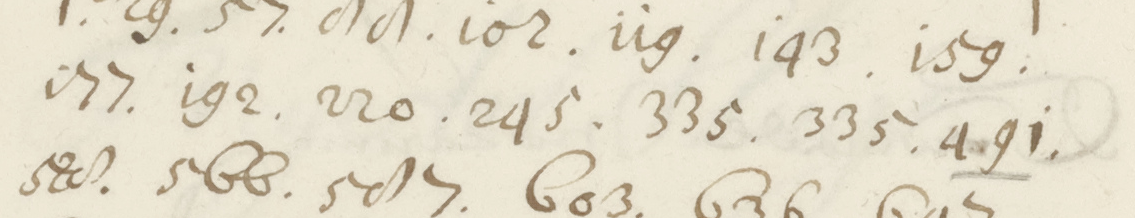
177, 192, 220, 245, 335, 335, 491,
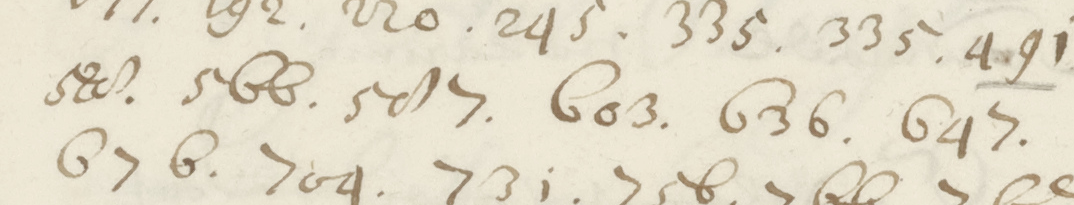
528, 566, 587, 603, 636, 647,
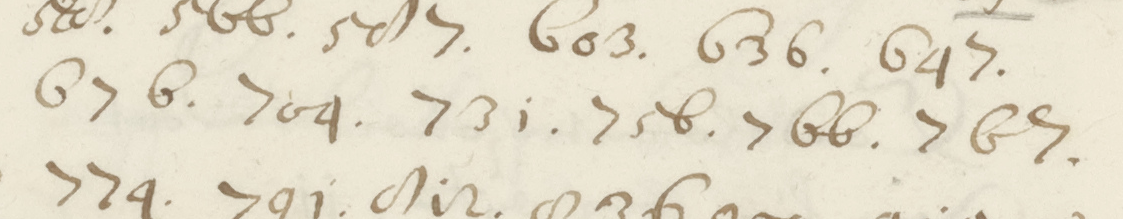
676, 704. 731, 756, 766, 767,
